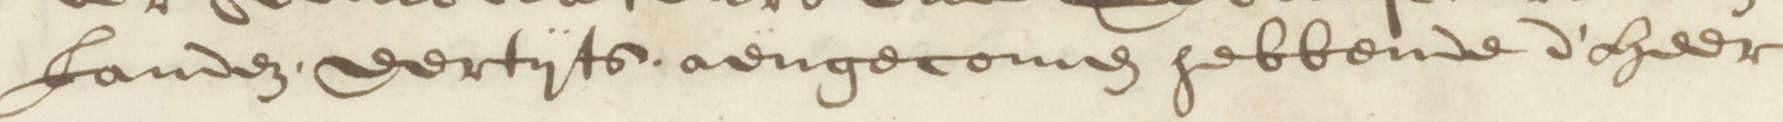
Landen eertijts aengecomen hebbende d'heer
